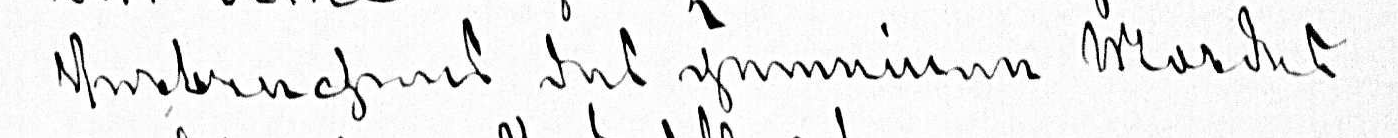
Verbrechens des gemeinen Mordes
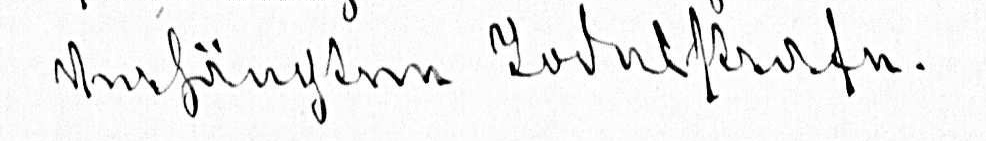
verhängten Todesstrafe.
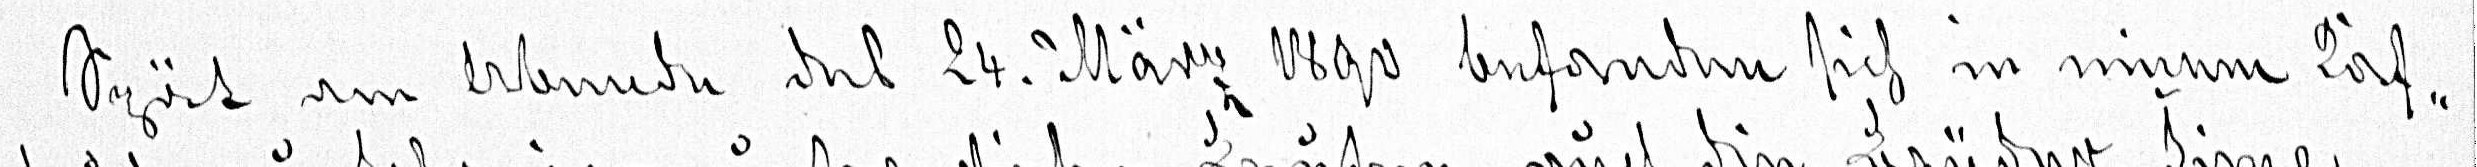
Spät am Abende des 24. März 1890 befanden sich in einem Caf¬
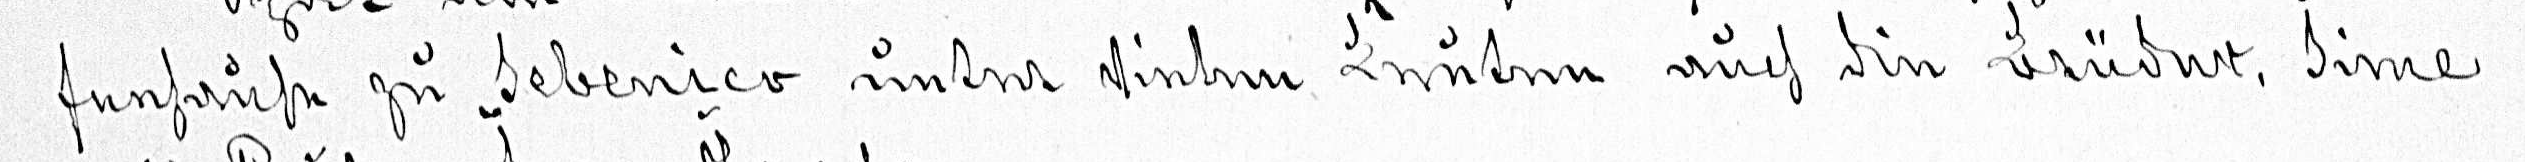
feehause zu Sebenico unter vielem Leuten auch die Brüder, Šime
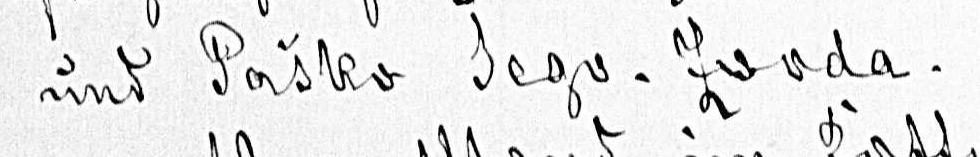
und Paško Šego-Žvoda.
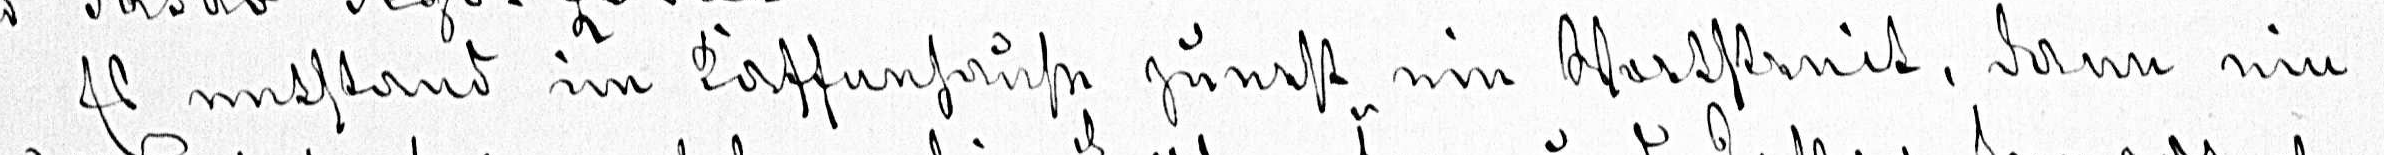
Es entstand im Kaffeehause zuerst ein Wortstreit, dann ein
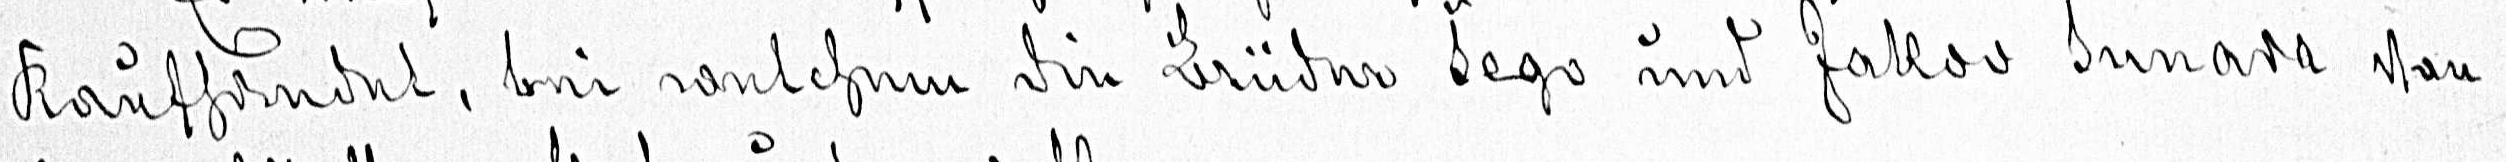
Raufhandel, bei welchem die Brüder Šime und Jakov Iunara von
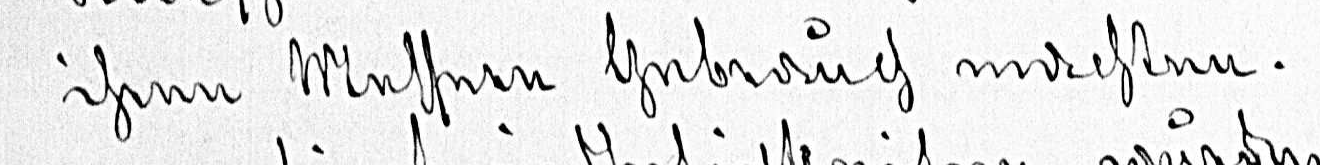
ihren Messern Gebrauch machten.
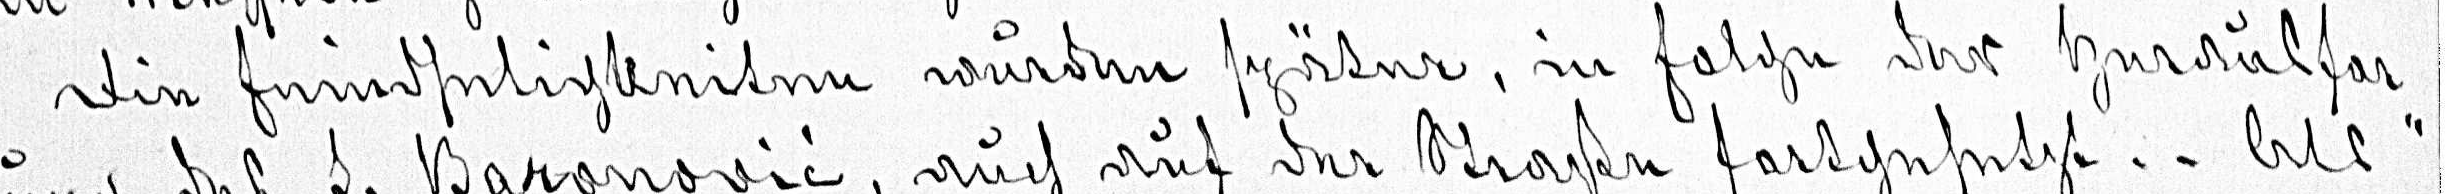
Die Feindseligkeiten wurden später, in Folge der Herausfor¬
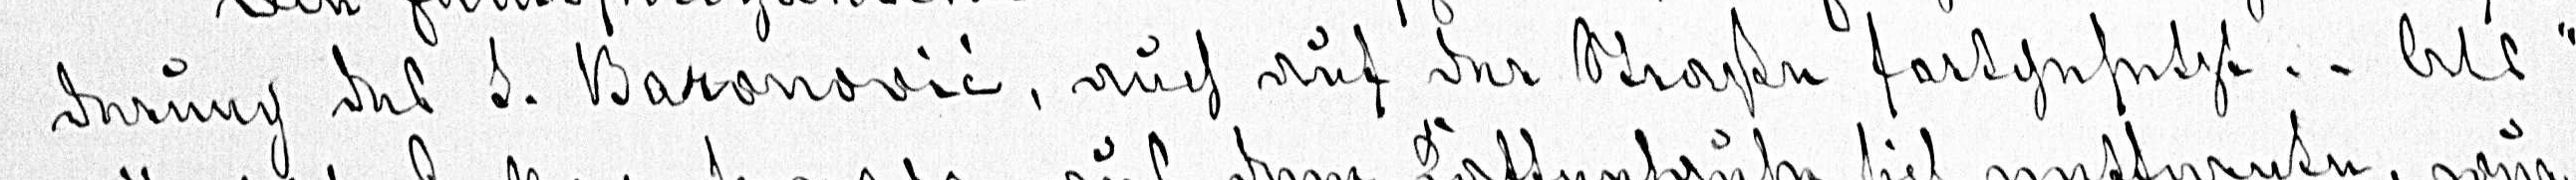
derung des I. Baronović, auch auf der Strase fortgesetzt. Als
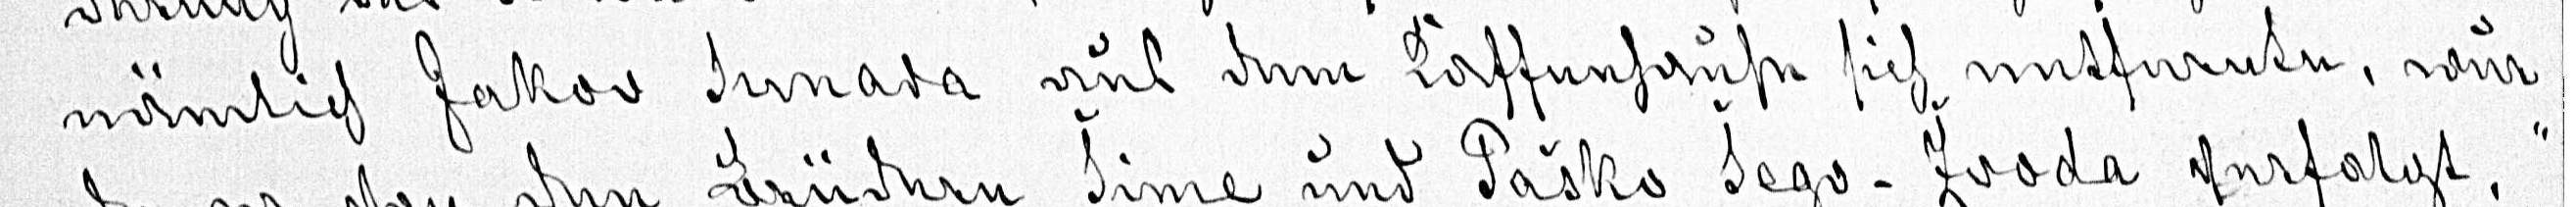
nämlich Jakov Iunara aus dem Kaffeehause sich entstanden, wur¬
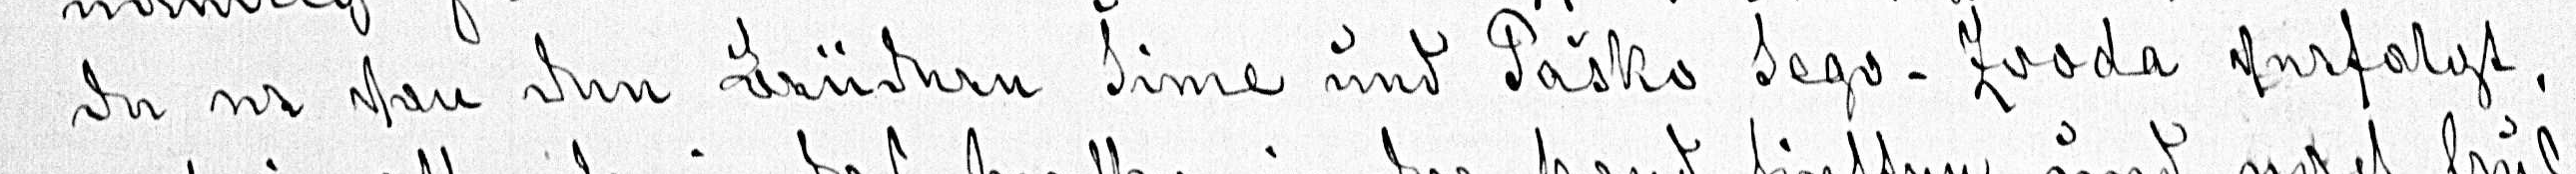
de er von den Brüder Šime und Paško Šego-Žvoda verfolgt,
